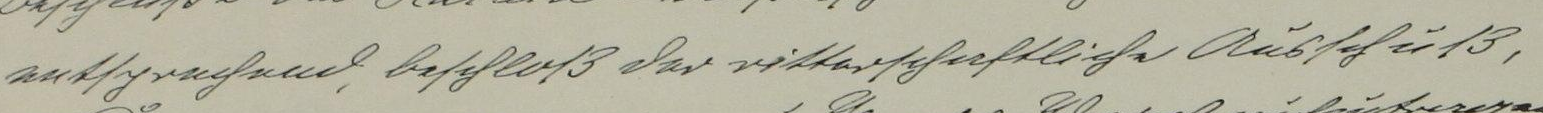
entsprechend, beschloß der ritterschaftliche Ausschuß,
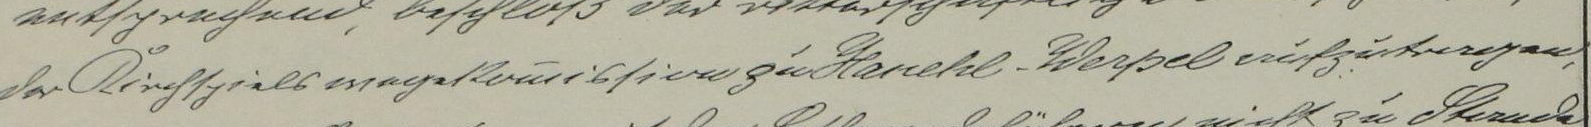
der Kirchspielswegekommission zu Hanhehl-Werpel aufzutragen,
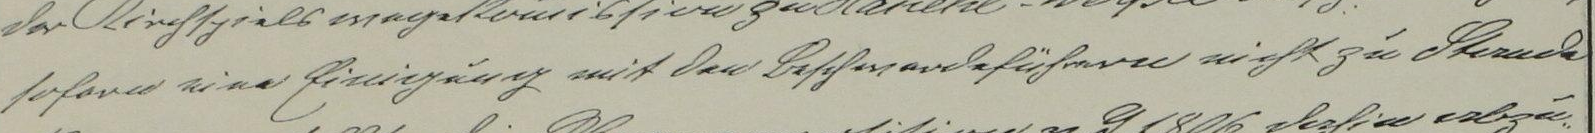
sofern eine Einigung mit den Beschwerdeführern nicht zu Stande
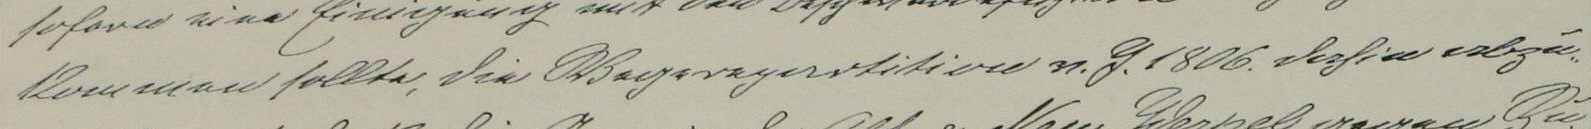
kommen sollte, die Wegerepartition v. J. 1806. dahin abzu-
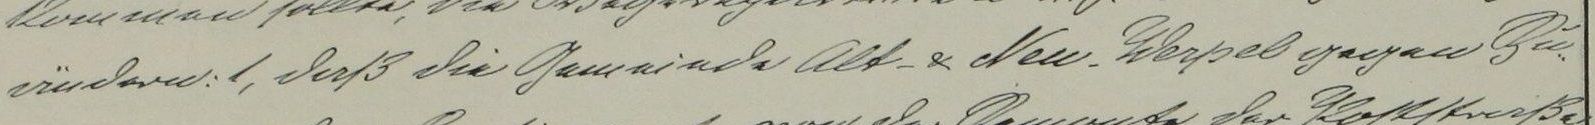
ändern: 1. daß die Gemeinde Alt- & Neu-Werpel gegen Zu-
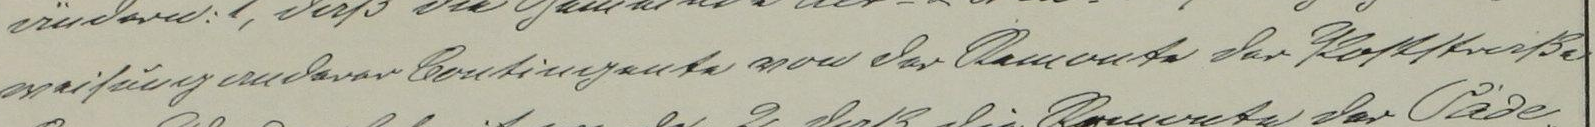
weisung anderer Contingente von der Remonte der Poststraße
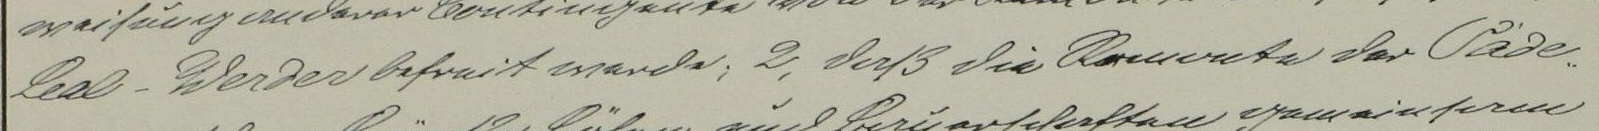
Leal – Werder befreit werde; 2. daß die Remonte der Pade-
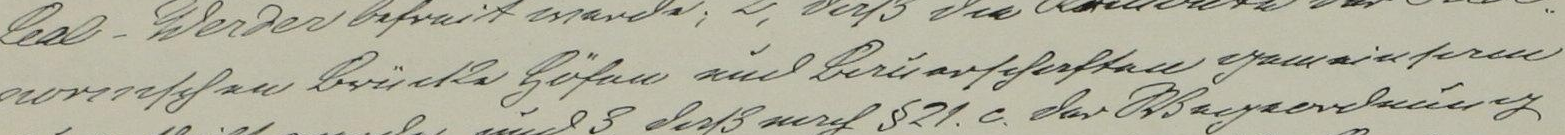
normschen Brücke Höfen und Bauerschaften gemeinsam
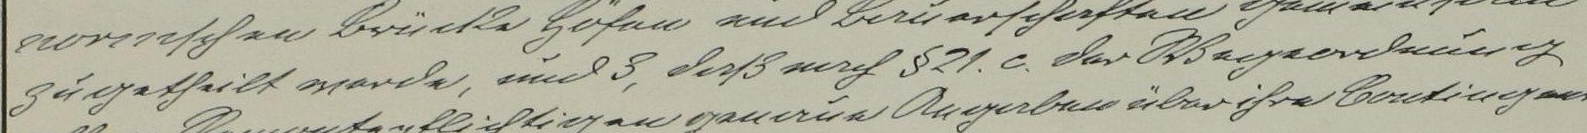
zugetheilt werde, und 3. daß nach § 21.c der Wegeordnung
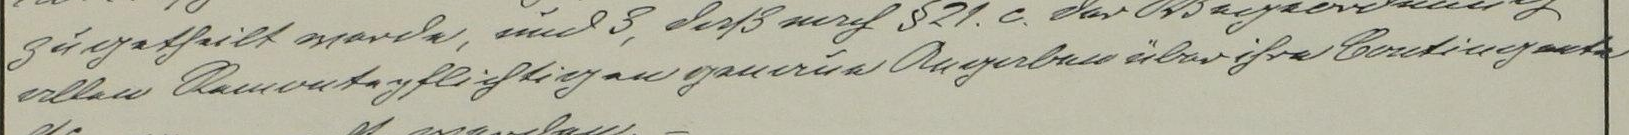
allen Remontepflichtigen genaue Angaben über ihre Contingente
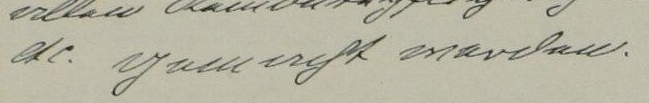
ac. gemacht werden.
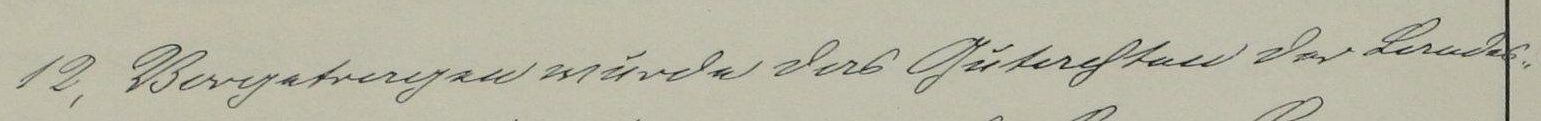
12. Vorgetragen wurde das Gutachten der Landes-
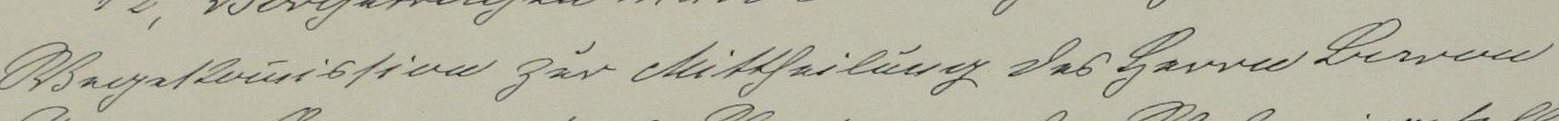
Wegekommission zur Mittheilung des Herrn Baron
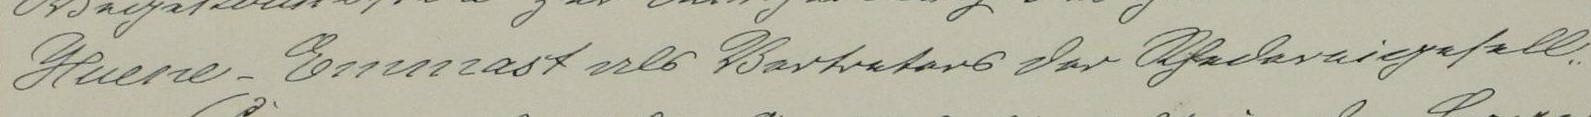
Huene-Emmast als Vertreters der Rhedereigesell-
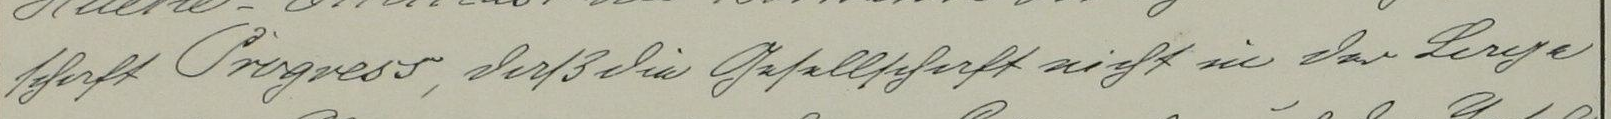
schaft Progress, daß die Gesellschaft nicht in der Lage
